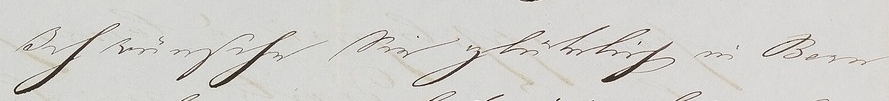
Ich wünsche Sie glüklich in Bern
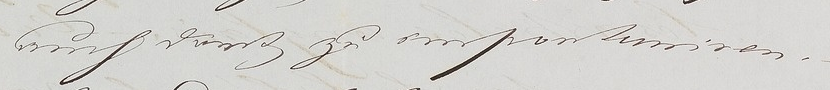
auch dort zu importuniren. –
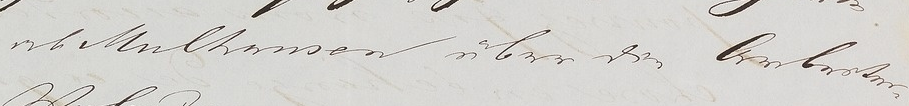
ab Mulhausen über die Arbeiter-
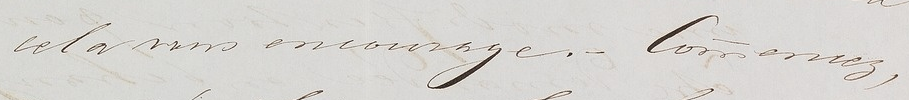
cela vous encourage. Commencez,
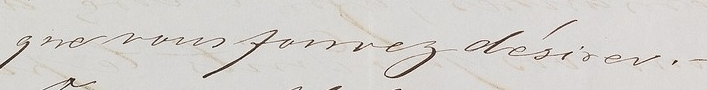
que vous pourrez désirer. –
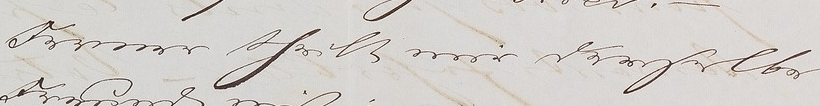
Ferner theilt mir derselbe
